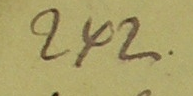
242
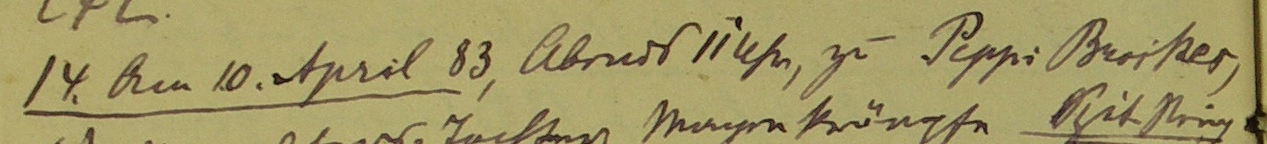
14. Am 10. April 83, Abends 11 Uhr, zu Peppi Broiker
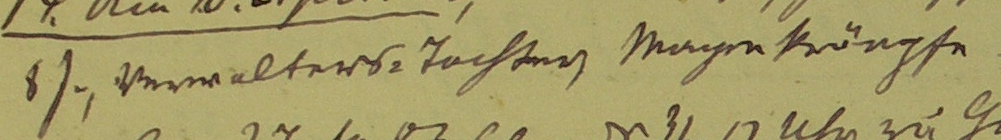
8 J. Verwalterstochter, Magenkrämpfe
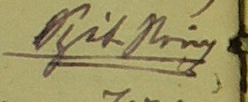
Spit Neug.
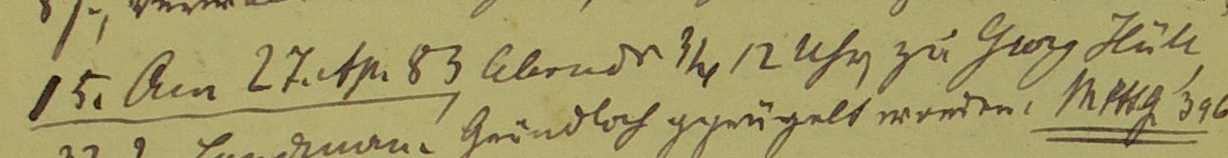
15. Am 27. Apr. 83, Abends ¾ 12 Uhr zu Georg Hüll,
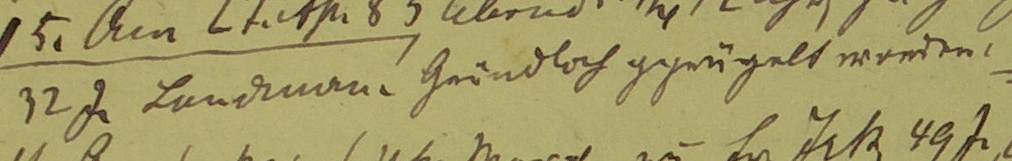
32 J. Landmann, Gründlich geprügelt worden
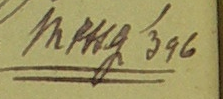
Mittelg. 396
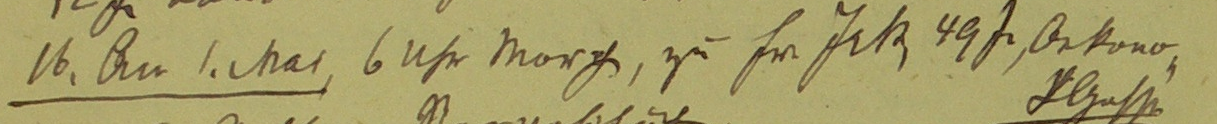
16. Am 1. Mai 83, 6 Uhr Morg. zu Fr. Irk 49 J. Oeko¬
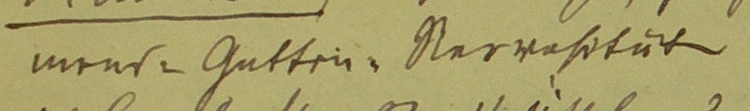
nomers Gattin, Nervositäten
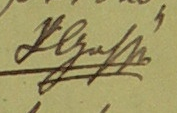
Lg.gasse
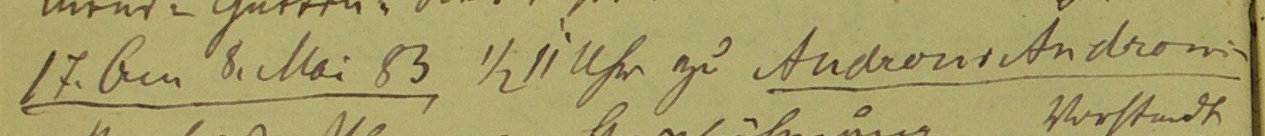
17. Am 8. Mai 83, 172 11 Uhr, zu Androni Andromi¬
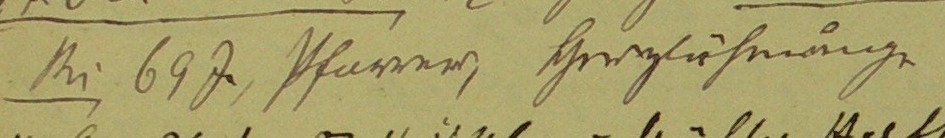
ki , 69 J. Pfarrer, Herzlähmungen
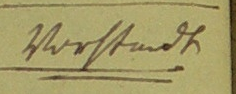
Vorstadt
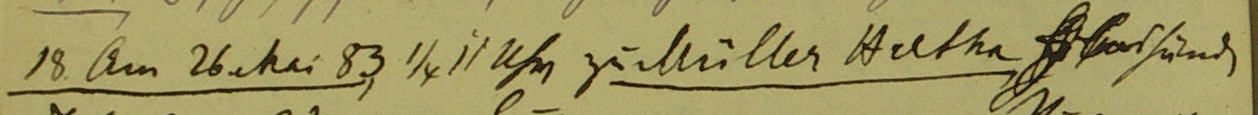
18. Am 26 April 83, 174 11 Uhr, zu Müller Hertha, Glaser
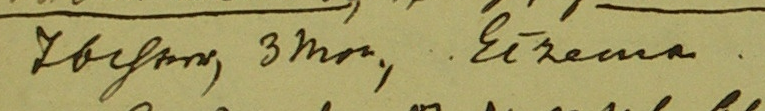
Tochter, 3 Monate Eczema
